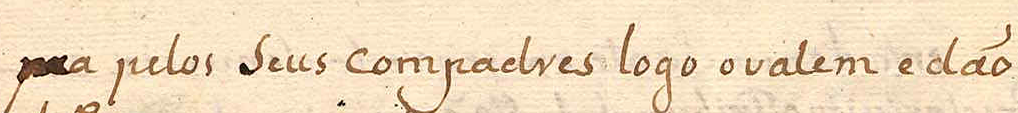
pra pelos seus compadres logo o valem, e daõ
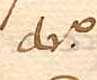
dr.o
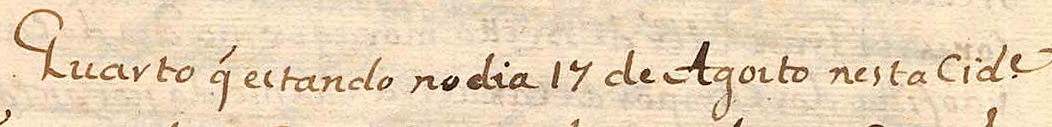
Quarto q̄ estando no dia 17 de Agosto nesta Cid.e
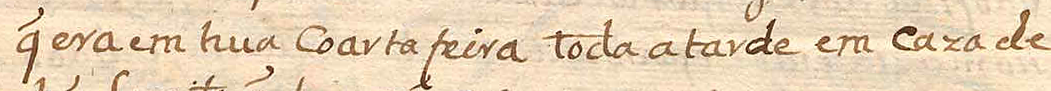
q̄ era em hua coarta feira toda a tarde em caza de
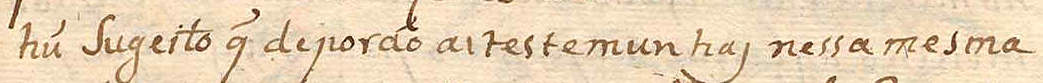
hū sugeito q̄ deporão as testemunhas nessa mesma
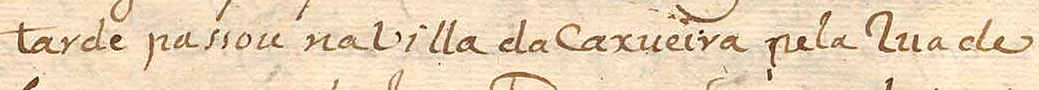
tarde passou na villa da Caxueira pela Rua de
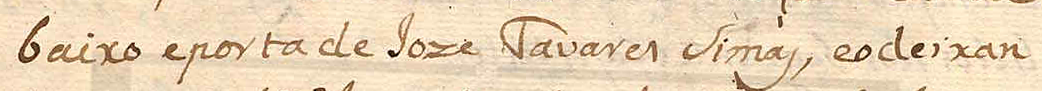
baixo e porta de Ioze Tavares Simas, e o deixan
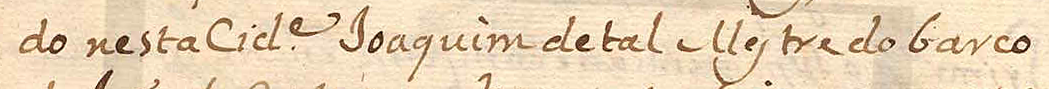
do nesta Cid.e Ioaquim de tal Mestre do barco
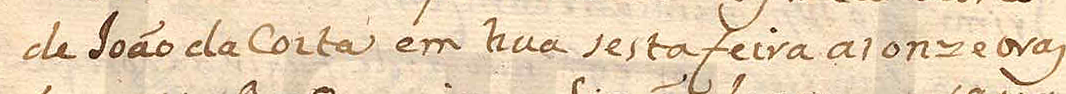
de Ioão da Costa em huā sesta feira as onze oras
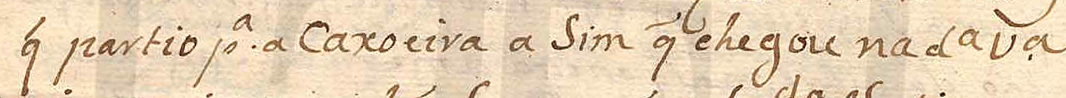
q̄ partio p.a a caxoeira aSim q̄ chegou na da V.a
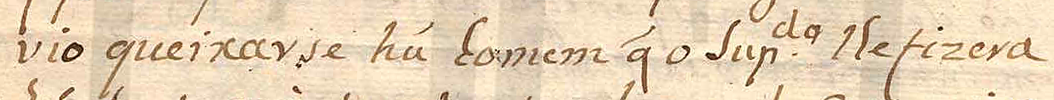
vio queixarse hū homem q̄ o sup.do lhe fizera
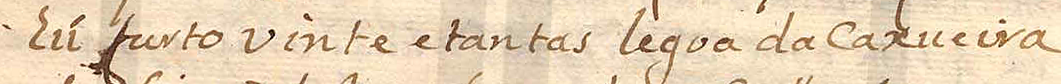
hū furto vinte e tantas legoa da caxueira
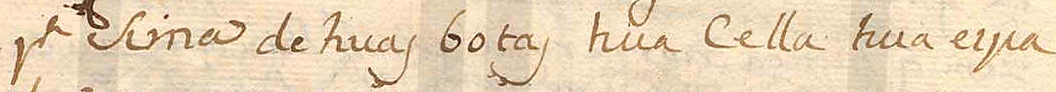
p.a sima de huas botas huā Cella huā espa
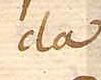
da
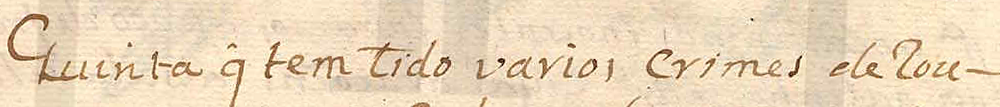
Quinta q̄ tem tido varios crimes de Rou
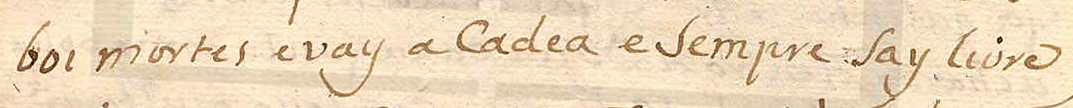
bos mortes e vay a Cadea e sempre say livre
